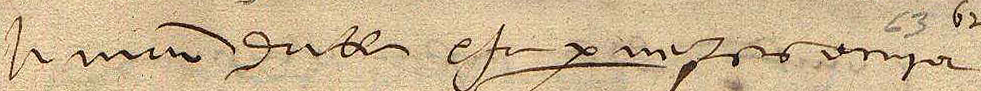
Jrmão da Re e Ja ꝑ uezes o curou
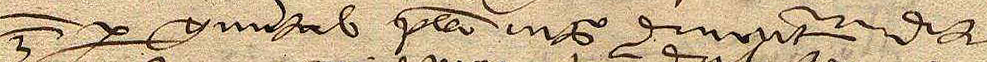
item ꝑguntado p̄llo arto da contradita
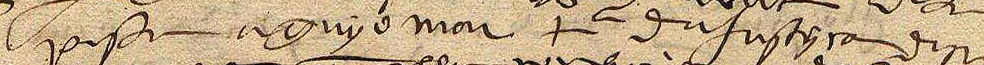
posta a guyomar ta da Justyça dise
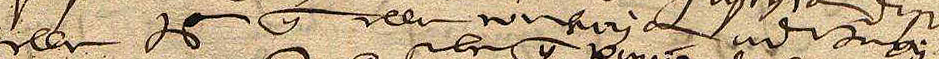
elle ta q̄ elle conhecya a dita gy
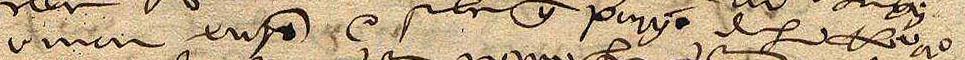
omar lujz e sabe q̄ paryo de hū Ro ao
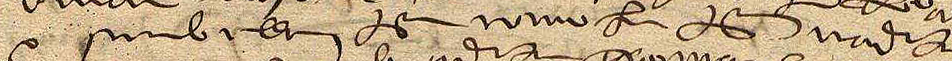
e sendo elle ta como he tam na dita
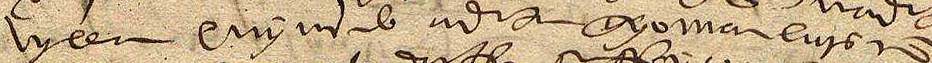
vylla e uyndo a dita gyomar lujs cō
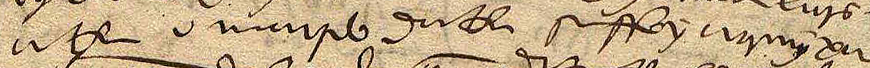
a Re o marjdo da Re se ffoy aqueyxar
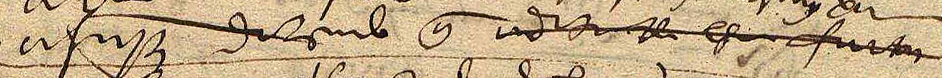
ao Juiz dizendo q̄ a dita Re lhe furtar
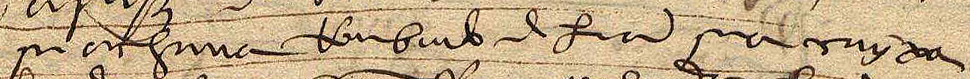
se achaua Roubado de huā sua cayxa
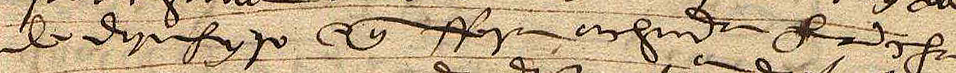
de dynheyro e q̄ ffora achada huā cha
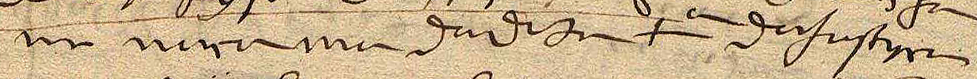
ue na cama da dita ta da Justyça
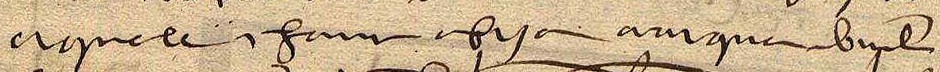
a quall chaue abrja a arqua donde
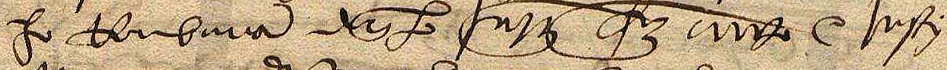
ho Roubauā de q̄ ho Juiz fez auto e Justy
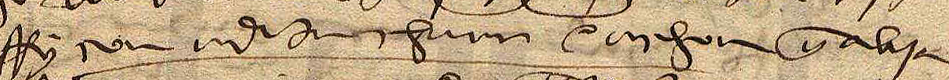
ffycou a dita chaue e achou q̄ abrja
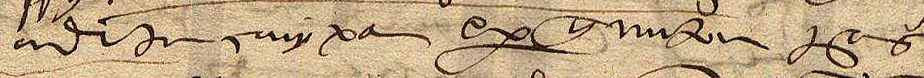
a dita cayxa e ꝑguntou tas
